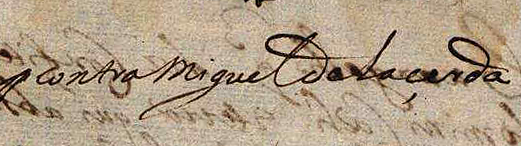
contra Miguel de Lacerda
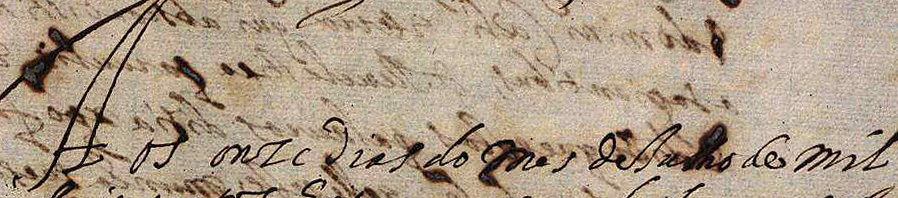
Aos onze dias do mes de Iulho de mil
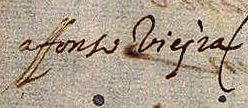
affonso Viejra
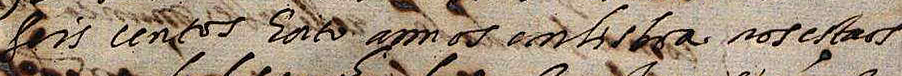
seiscentos E oito annos em Lisboa. nos estaos
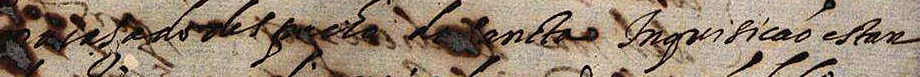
na casa do despacho da Sancta Inquisiçaõ estan
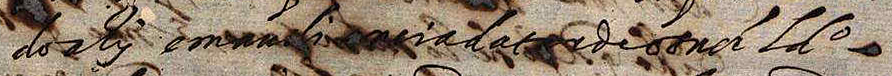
do ahy em audiencia da tarde o snor̄ Ldo
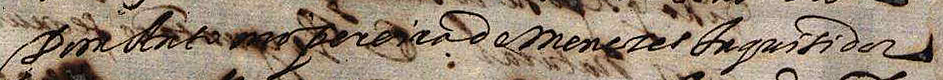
Dom Antonio pereira de menezes Inquisidor
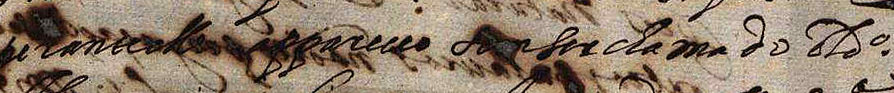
perante elle appareceo sem ser chamado o ld.o
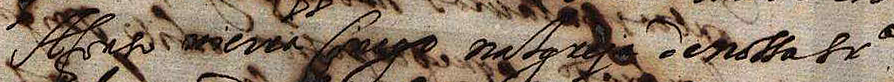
Afonso vieira Conego na Igreja de nossa sra
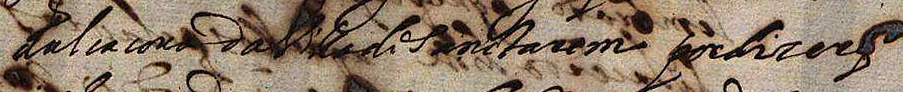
dalcaçoua da Villa de sanctarem por dizer q̄
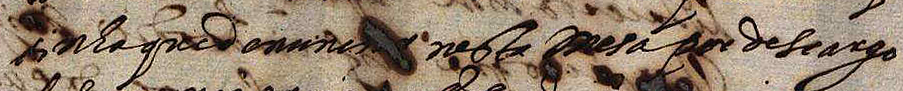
tinha que denunciar nesta mesa por descargo
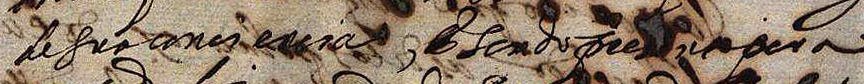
de sua conciencia, E sendo presente pera
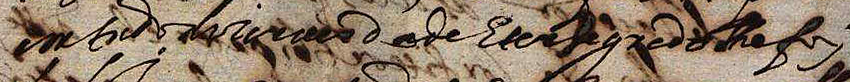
em tudo dizer uerdade E ter segredo lhe foj
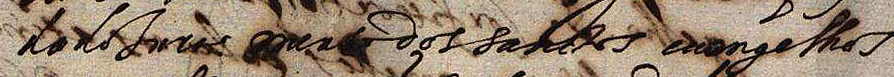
dado Iuramento dos sanctos euangelhos
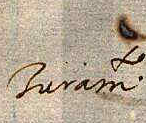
Iuram.to
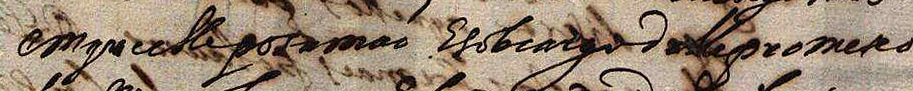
em que elle pos a maõ E sob cargo delle prometeo
